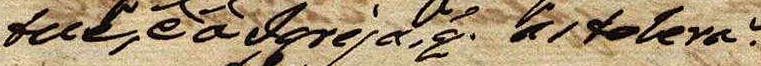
tue, ê â Jgreja, q̄ as tolera.
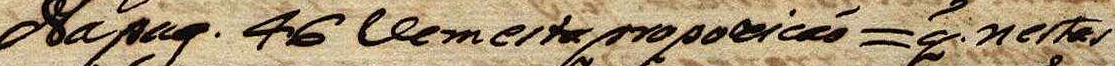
Na pag. vem esta propozicaõ = q̄. nestas
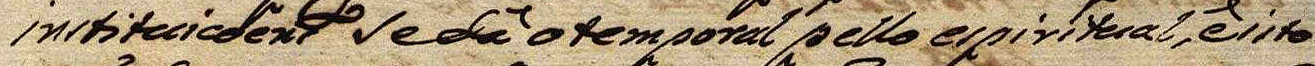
instituiçoens se dâ o temporal pello espiritual, ê isto
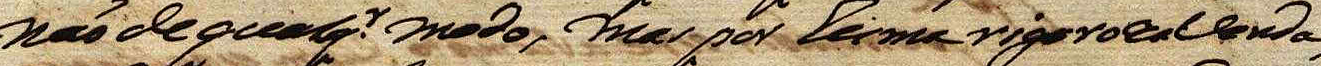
naõ de qualq.r modo, mas por huma rigoroza venda,
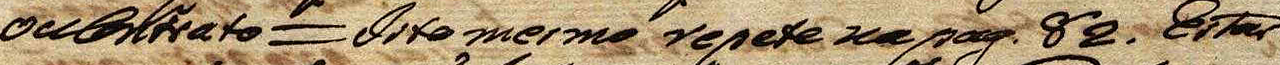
ou Contrato = Isto mesmo repete na pag. 82. Estas
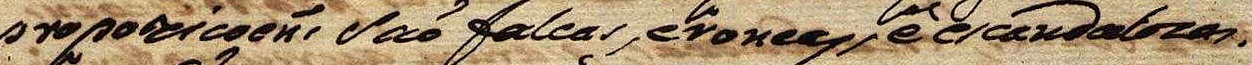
propozicoeñs saõ falcas, eroneas, ê escandalozas.
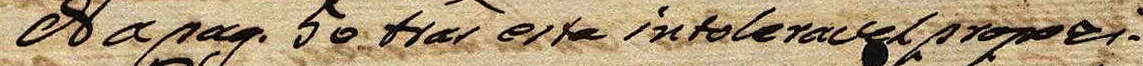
Na pag. 50 trâs esta intoleravel propozi
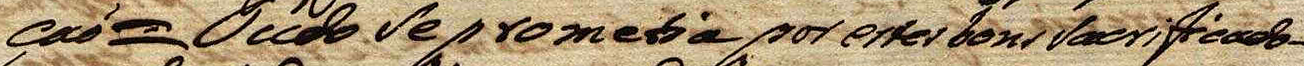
çaõ = Tudo se prometia por estes bons sacrificado
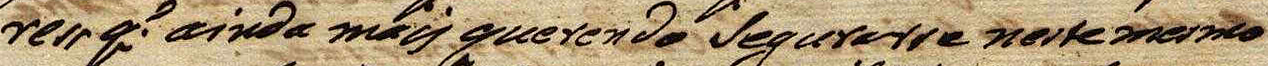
ress q̄. ainda mais querendo segurarse neste mesmo
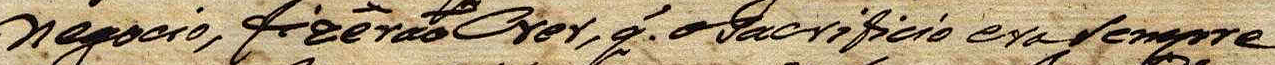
negocio, fizêraõ Crer, q̄ o sacrificio era sempre
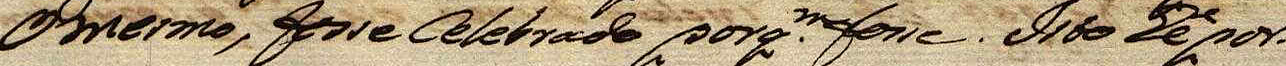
o mesmo, fosse Celebrado porq.m fosse. Isto hê por
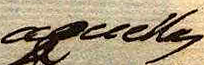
aquelles
